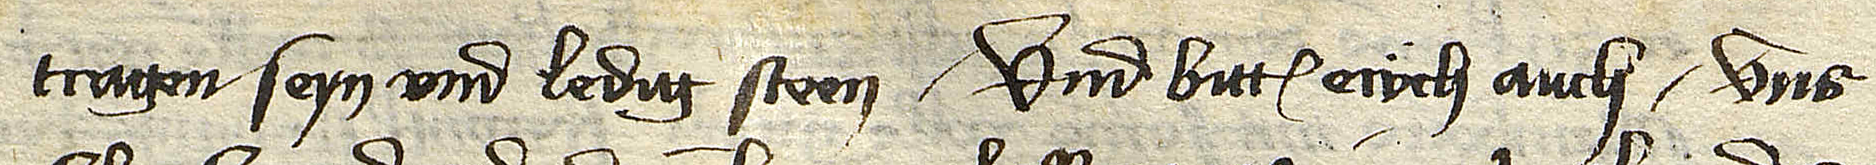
tragen ſeyn vnd ledig ſteen / Vnd bitt* ewch auch / Vns
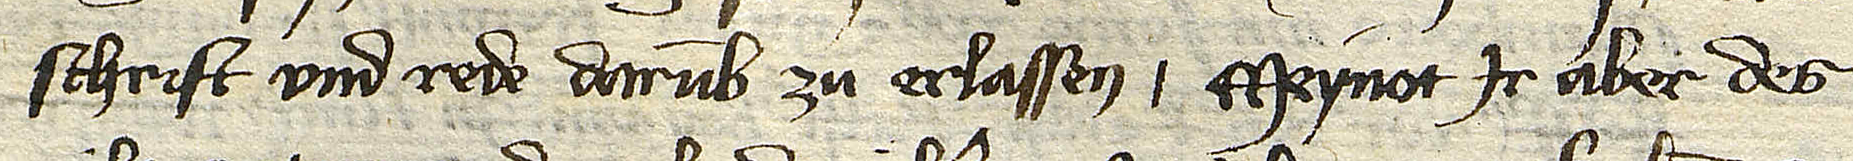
ſchrift vnd rede daru*b ʒu erlaſſen / Meynot Ir aber des
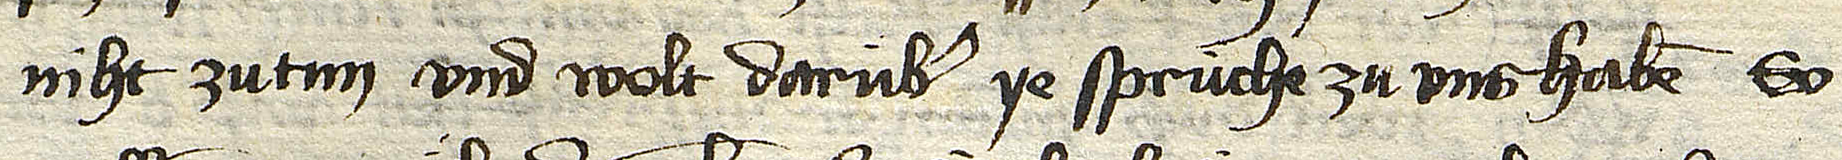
niht ʒu tun vnd wolt darub* ye ſprüche ʒu vns habe* So
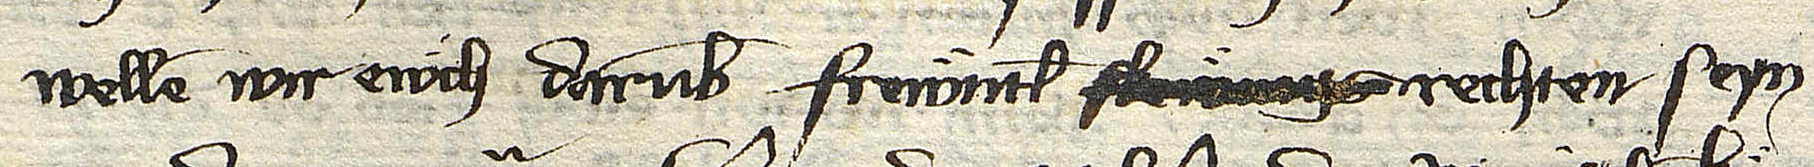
welle* wir ewch daru*b frewntl* ſlewnigs rechten ſeyn
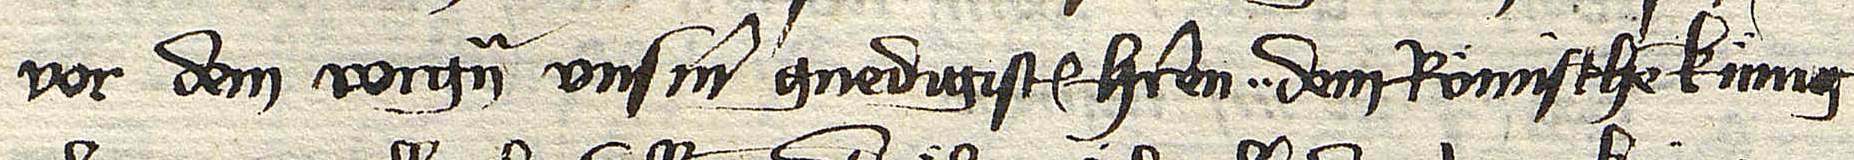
vor dem vorgn* vnſ*m gnedigiſt* h*ren ~ dem Römiſche* künig
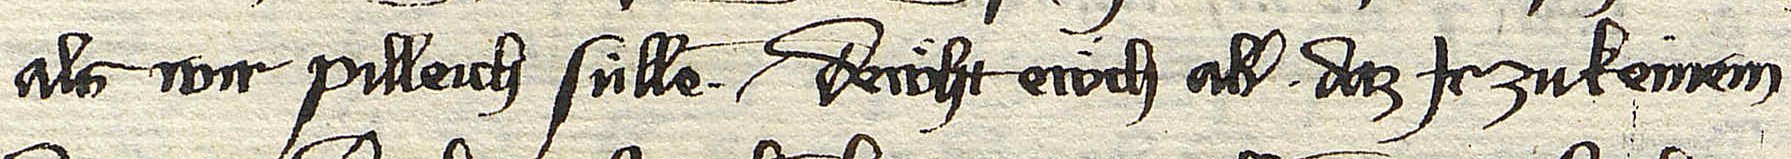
als wir pilleich ſülle* . / Dewcht ewch ab* . daʒ Ir ʒ keinem
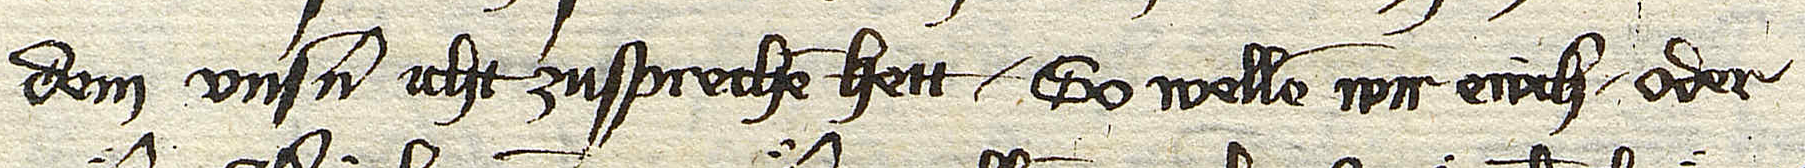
dem vnſ*n ich ʒuſpreche* hett / So welle* wir ewch / oder
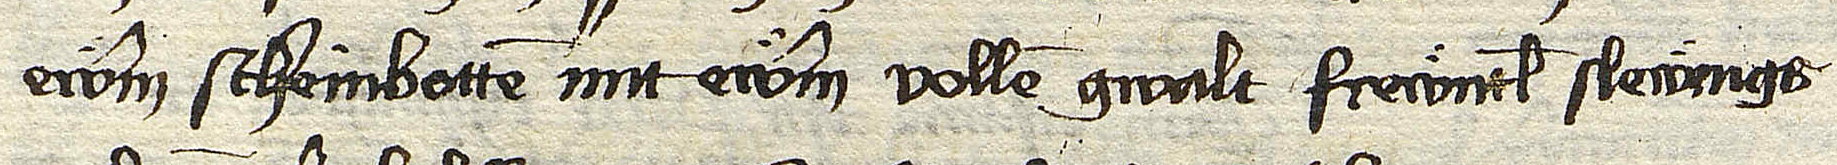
ew*m ſcheinbotte* mit ew*m volle* gwalt frewntl* ſlewnigs
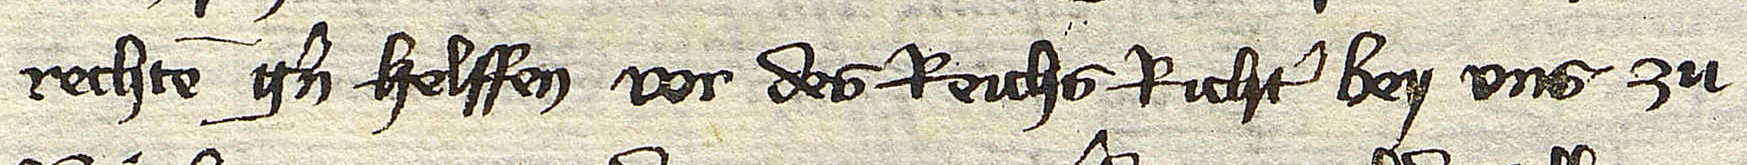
rechte* g*n helffen vor des Reichs Richt* bey vns ʒu
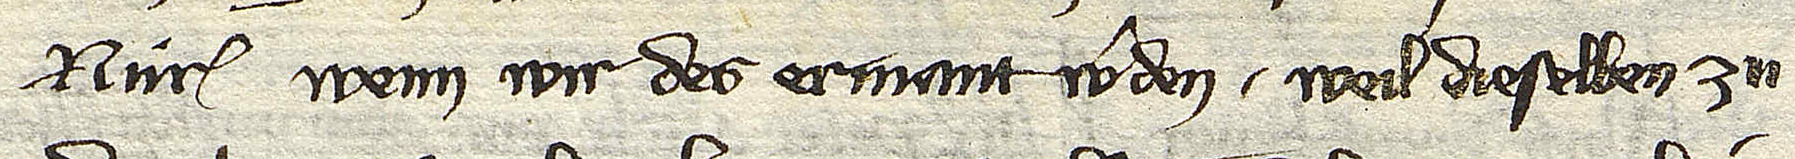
Nür* wenn wir des ermant w*den / weil dieſelben ʒu
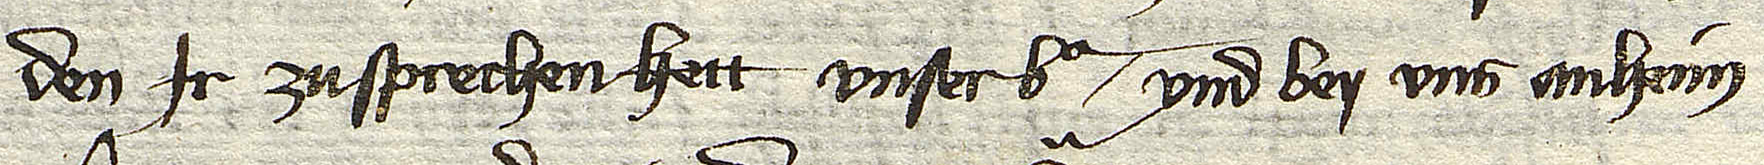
den Ir ʒuſprechen hett vnter b* / vnd bey vns anheim
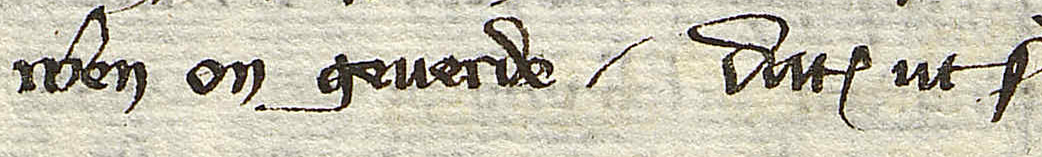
w*en on geuerde / Dat* ut ſ*
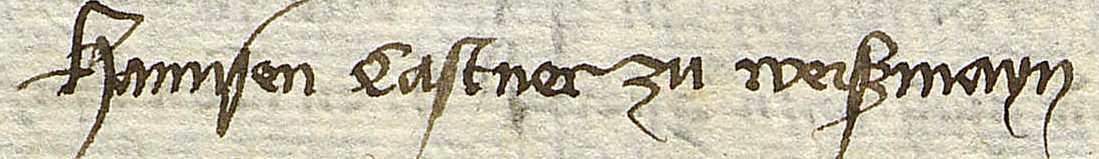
Hannſen Caſtner ʒu Weiſʒmayn
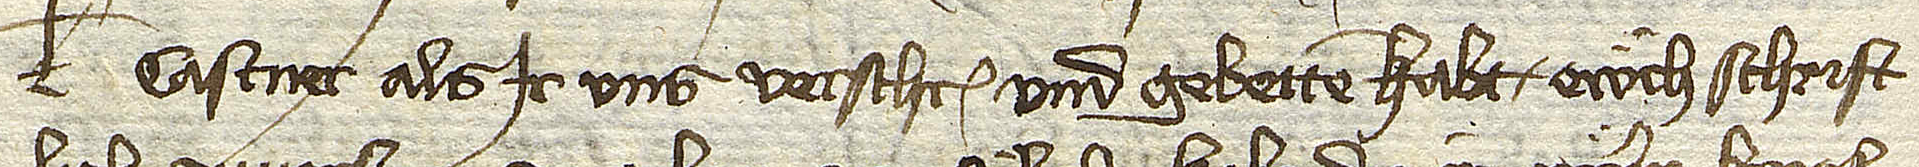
L* Caſtner als Ir vns verſchr* vnd gebette* habt / ewch ſchrift
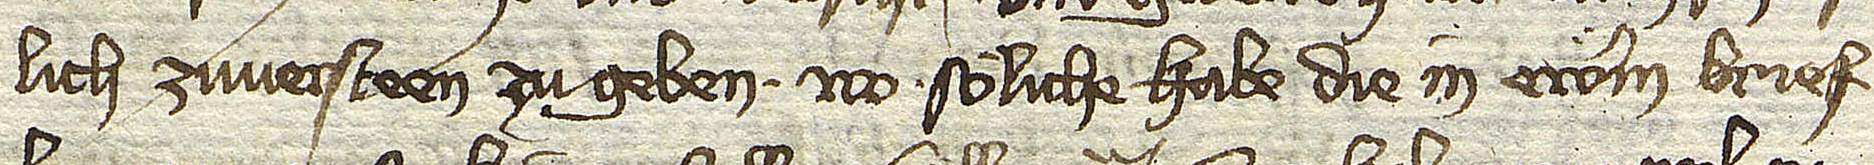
lich ʒuuerſteen ʒu geben . wo . ſöliche habe die in ew*m brief
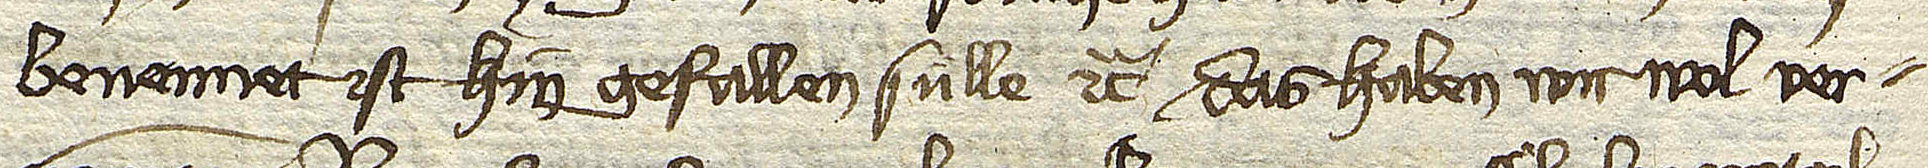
benennet iſt hin gefallen ſülle ec* / das haben wir wol ver =
